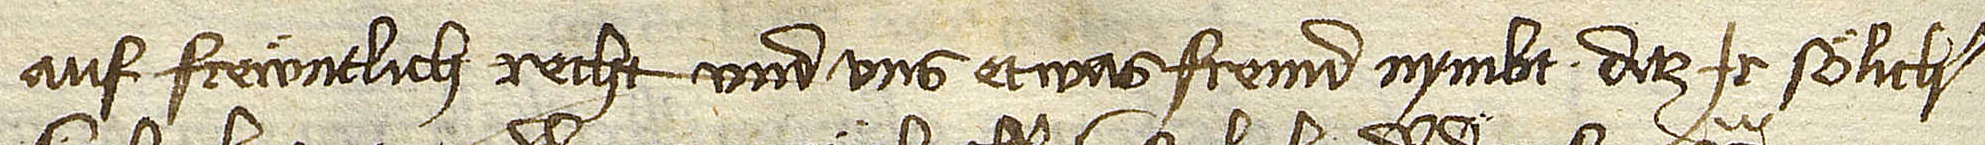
auf frewntlich recht vnd vns etwas fremd nymbt . daʒ Ir ſölich*
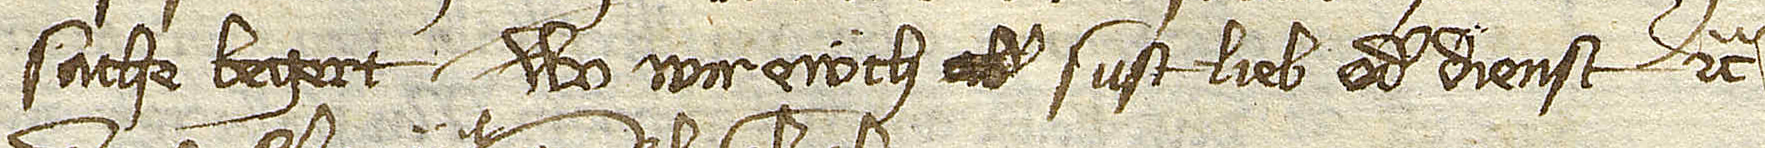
ſache begert . / Wo wir ewch ab* ſuſt lieb od* dienſt ec*
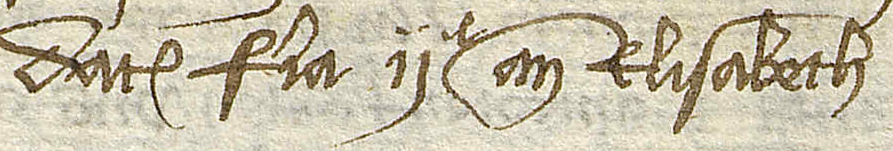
Dat* fia* ii* an* Eliſabeth
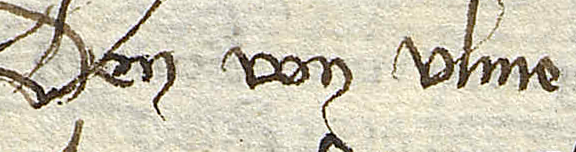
Den von vlme
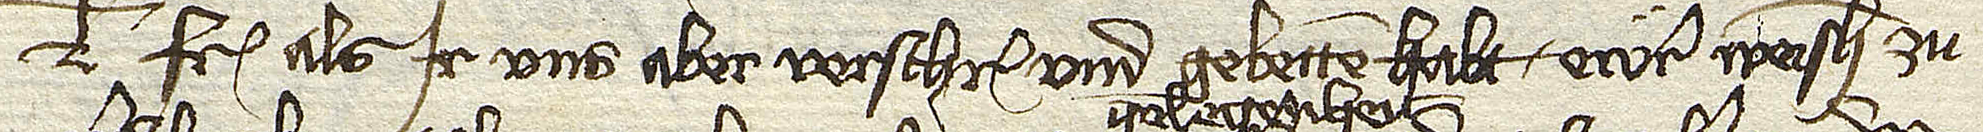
L* fr* als Ir vns verſchr* vnd gebette* habt / ew*r weiſh* ʒu
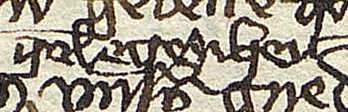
gelegenheit
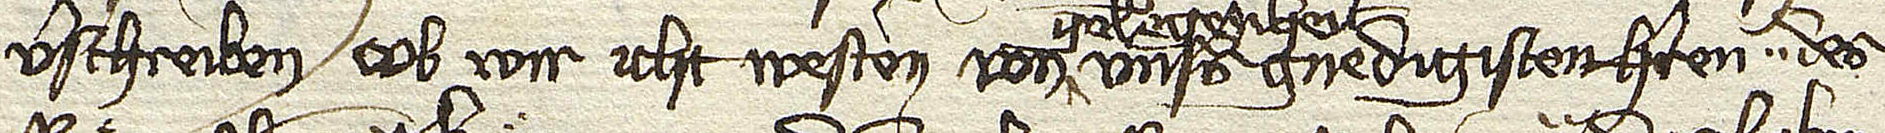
v*ſchreiben Ob wir icht weſten von vnſ*s gnedigiſten h*ren ~ des
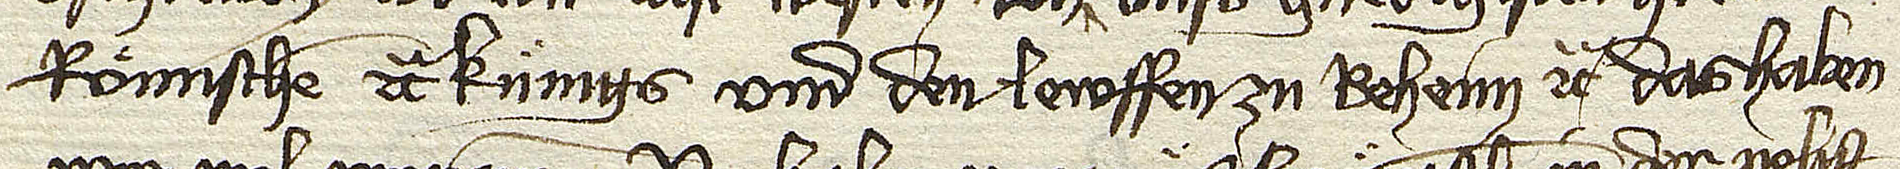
Römiſche* ec* künigs vnd den lewffen ʒu Beheim ec* das haben
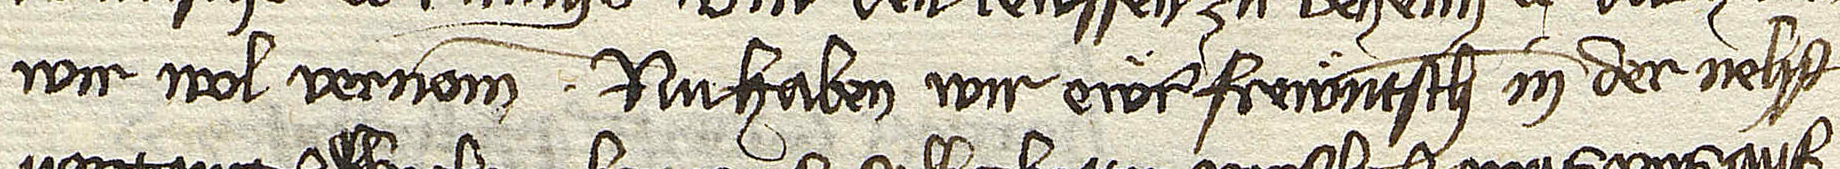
wir wol vernom* . Nu haben wir ew*r frewntſch* in der nehſt
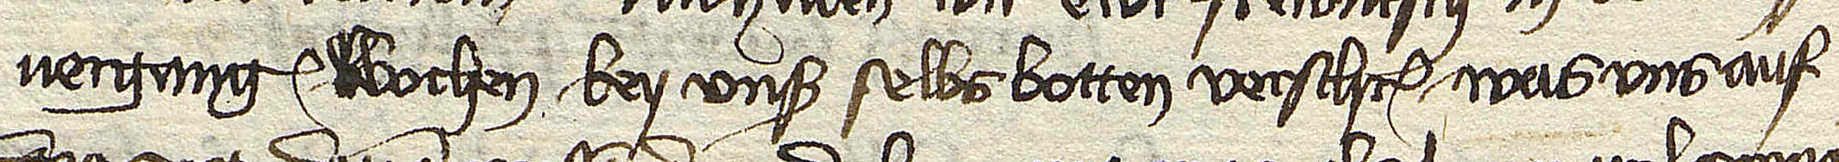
uergang* Wochen bey vnſ* ſelbs botten verſchr* / was vns auf
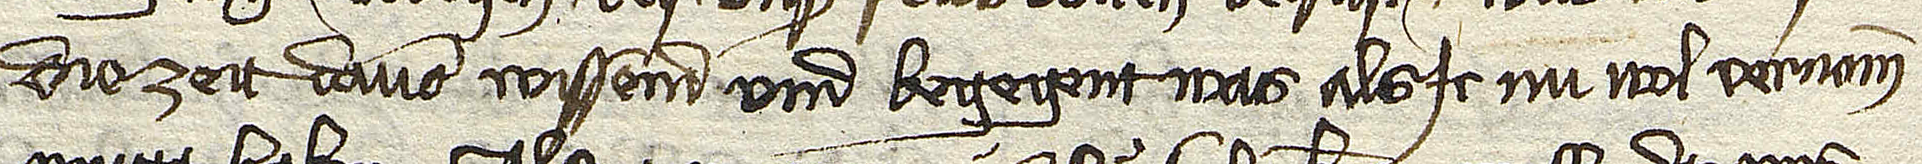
die ʒeit dauo* wiſſend vnd begegent was als Ir nu wol vernom*
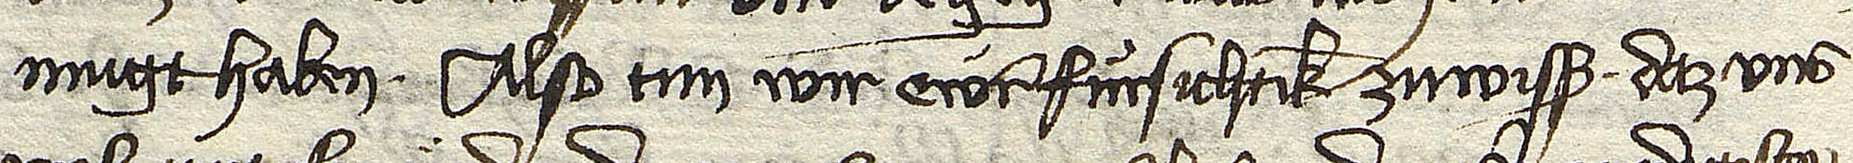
mugt haben . Alſo tun wir ew*r fürſichtik* ʒuwiſſ* . daʒ vns
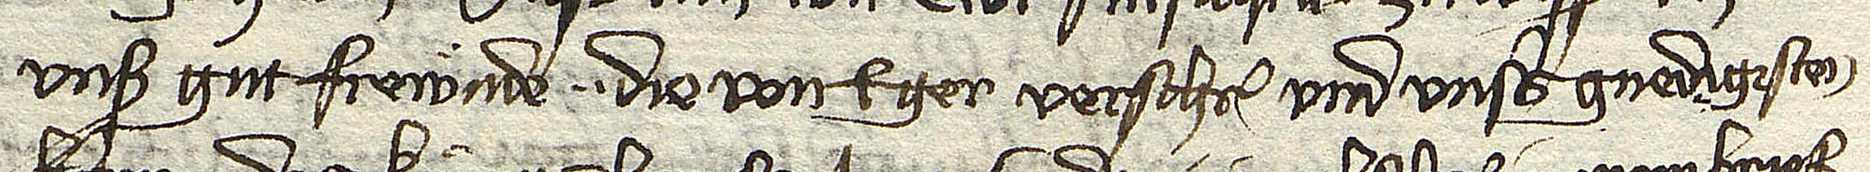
vnſ* gut frewnde ~ die von Eger verſchr* vnd vnſ*s gnedigiſten
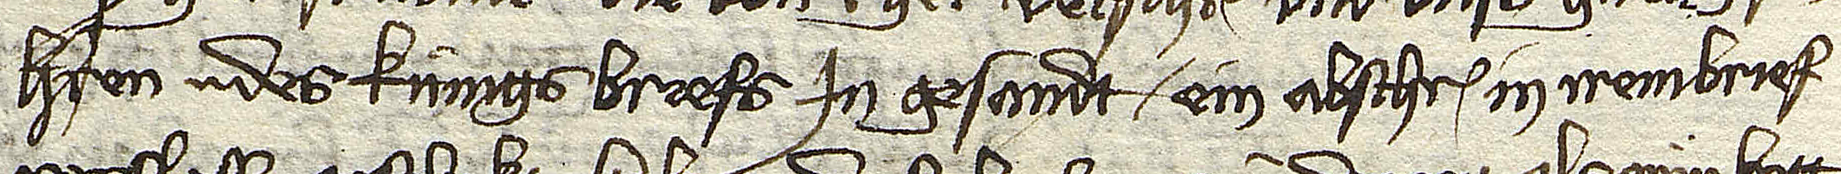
h*ren ~ des künigs briefs In geſandt / ein abſchr* in irem brief
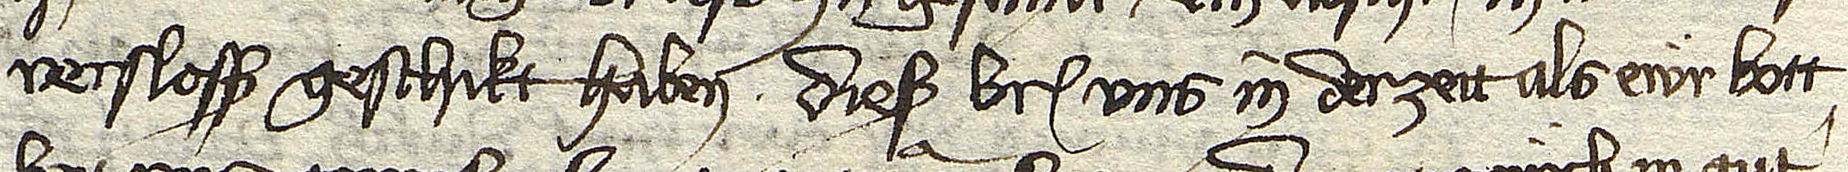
verſloſſ* geſchikt haben . Dieſ* br* vns in derʒeit als ewr bott
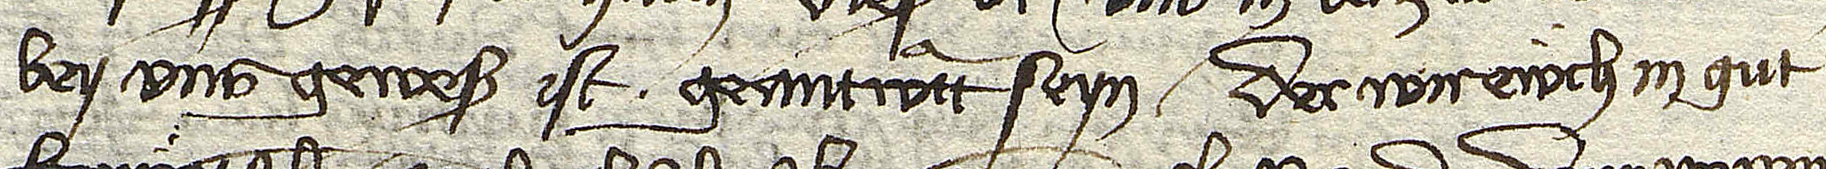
bey vns geweſ* iſt . geantw*tt ſeyn / Der wir ewch in gut*
